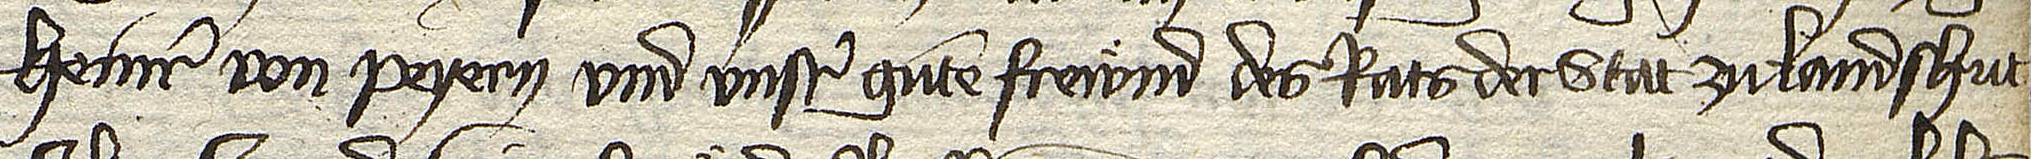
Heinr* von peyern vnd vnſr* gute* freẅnd des Rats der Stat ʒu landſhut
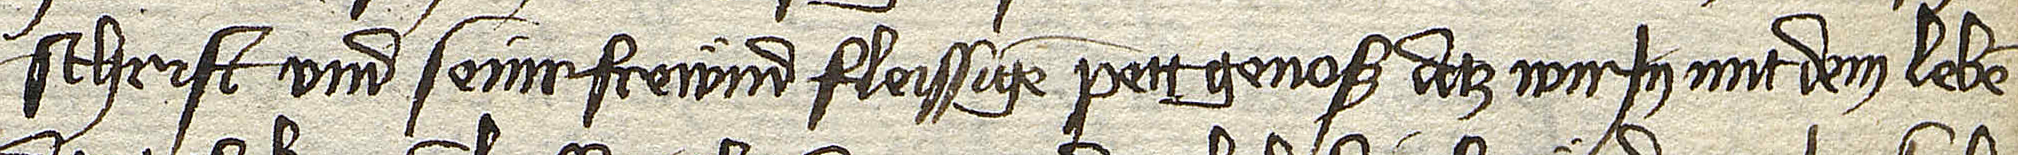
ſchrift vnd ſeinr freẅnd fleiſſige* Pett genoſʒ daʒ wir In mit dem lebe*
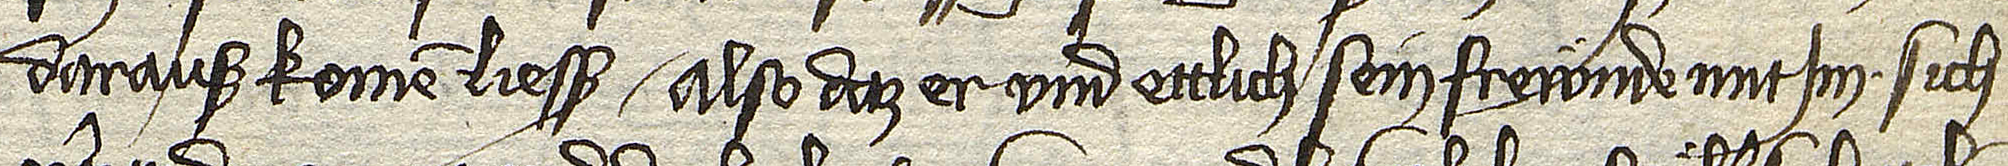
darauſʒ kome* lieſſ* / Alſo daʒ er vnd ettlich ſein freẅnde mit Im . ſich
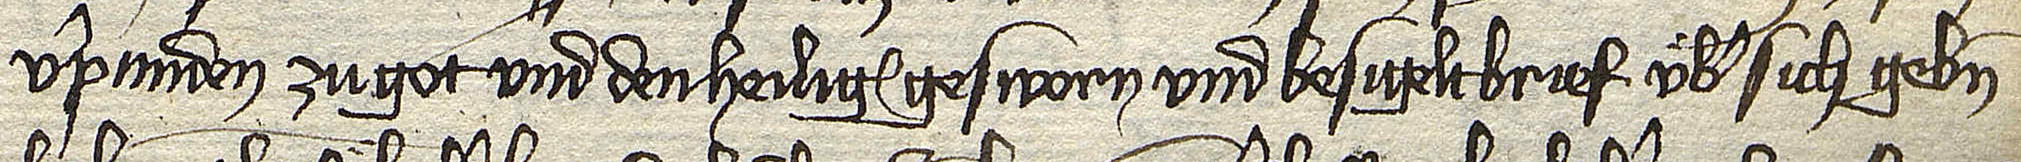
v*punden ʒu got vnd den heilig* geſworn vnd beſigelt brief v̈b* ſich gebn*
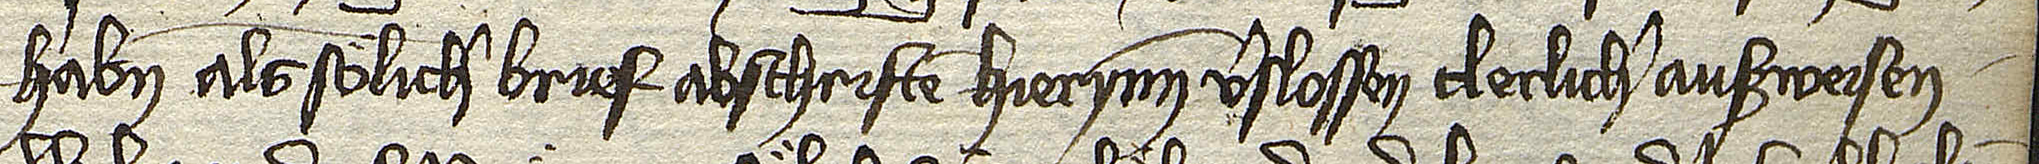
habn* als ſölich* brief abſchrifte* hierynn* v*ſloſſen clerlich* auſʒweiſen -
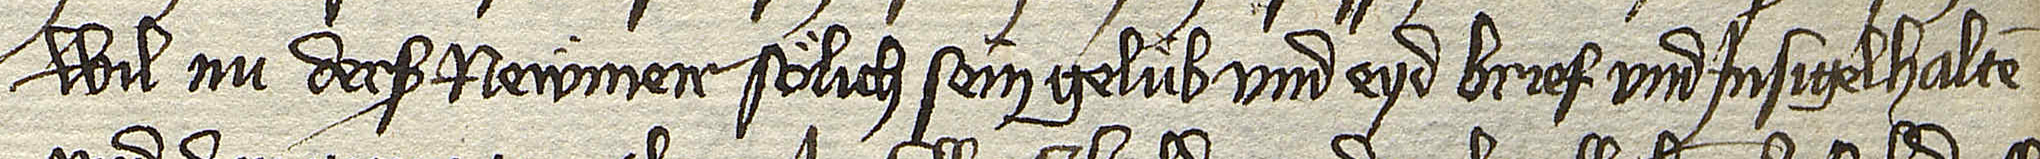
wil nu derſ* Neẅmeir ſölich ſein gelüb vnd eyd brief vnd Inſigel halte*
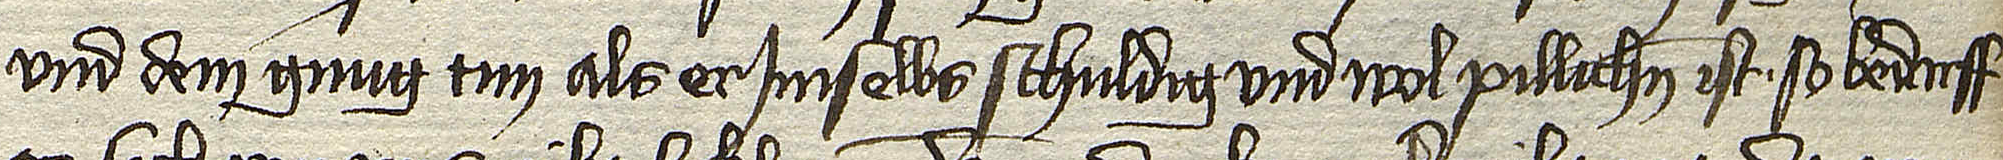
vnd dem gnug tun als er Imſelbs ſchuldig vnd wol pillichn* iſt . ſo bedurff
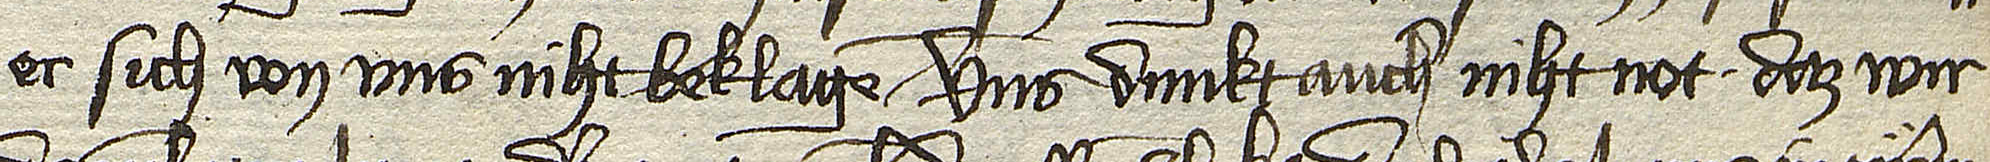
er ſich von vns niht beklage* / Vns dunnkt auch niht not . daʒ wir
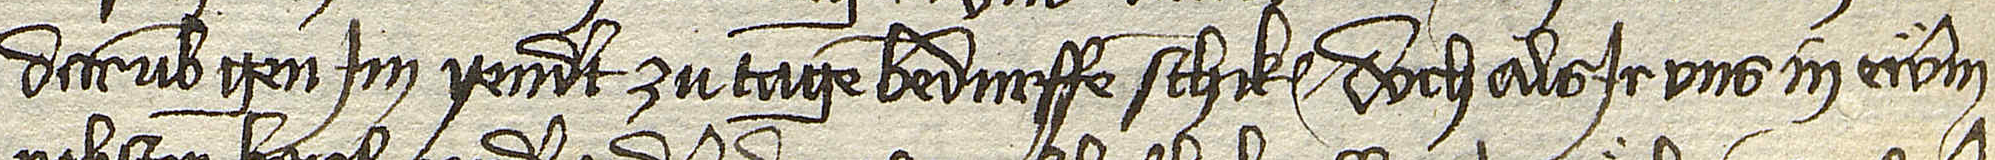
darub* gen Im yend*t ʒu tage* bedurffe* ſchik* / Doch als Ir vns in eẅ*m
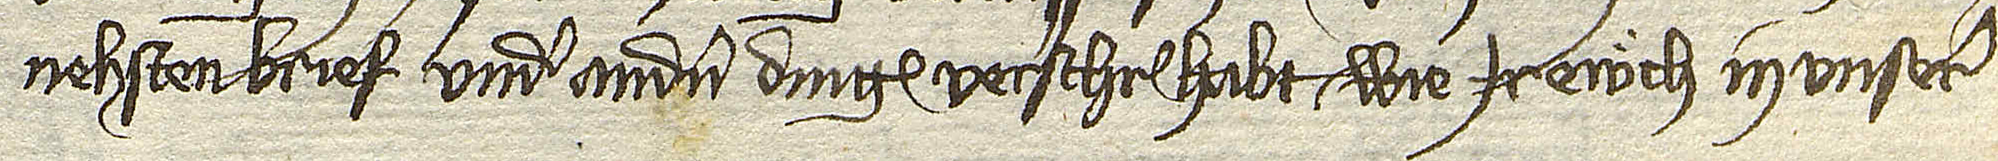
nehſten brief vnd* andn* ding* verſchr* habt / wie Ir eẅch in vnſer*
